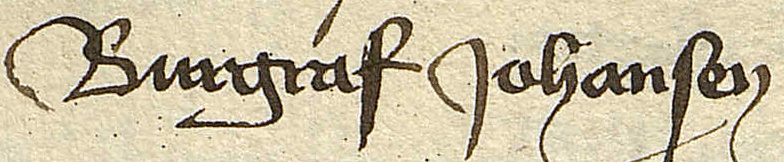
Burgraf Iohanſen
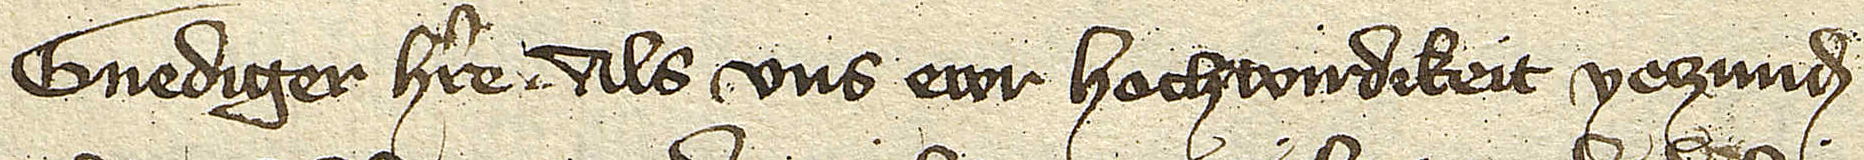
Gnediger h*re / Als vns ewr hochwirdikeit yecʒund*
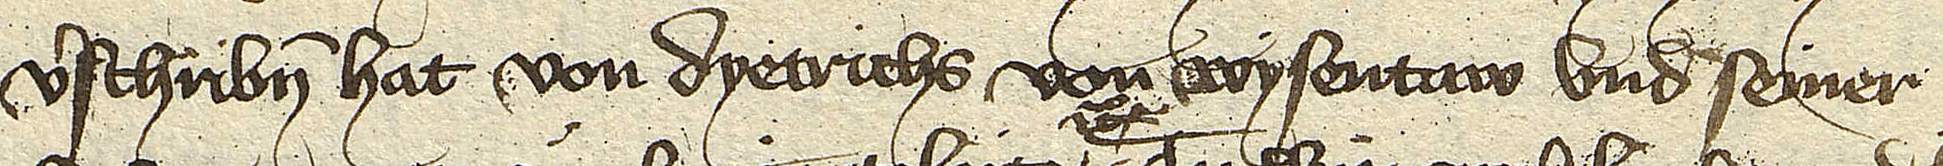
v*ſchribn* hat von dyetrichs von wyʒentaw vnd ſeiner
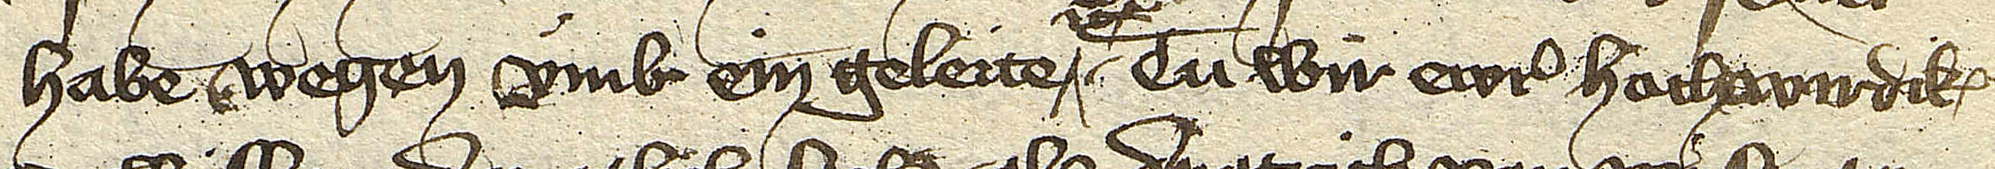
habe wegen v̈mb ein geleite / Tu wir ewr* hochwirdik*
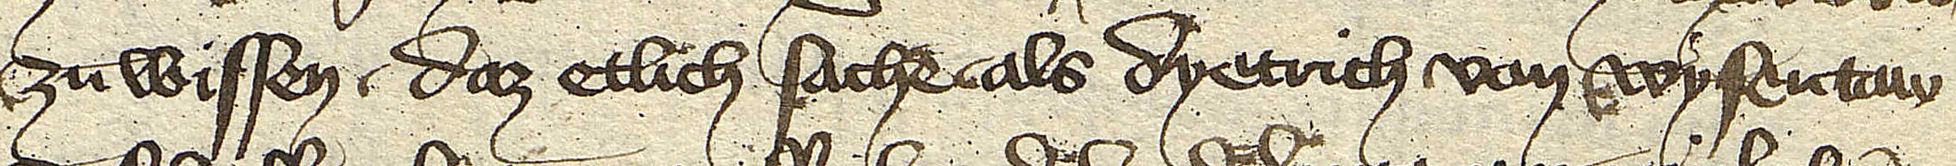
cʒu wiſſen / daʒ etlich ſache / als dyetrich von wyſentaw
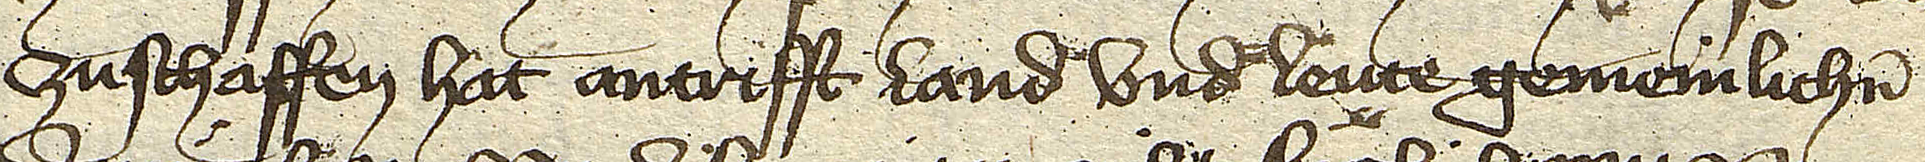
cʒuſchaffen hat antrifft land vnd leute gemeinlichn*
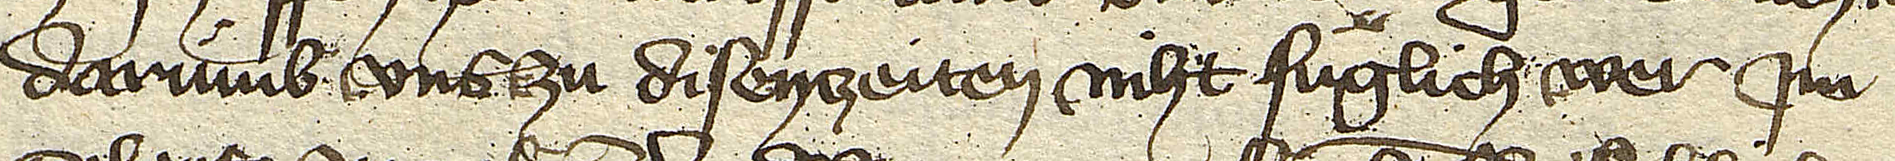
darümb vns cʒu diſen cʒeiten niht füglich wer Im
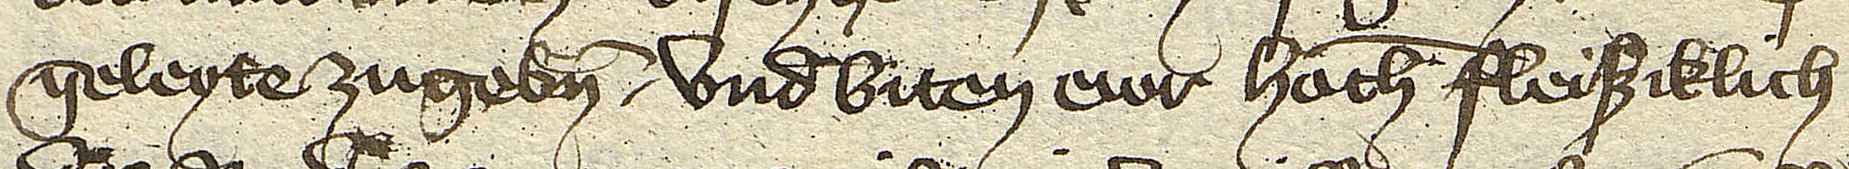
geleyte cʒu gebn* / vnd biten ewr hoch* fleiʒiklich
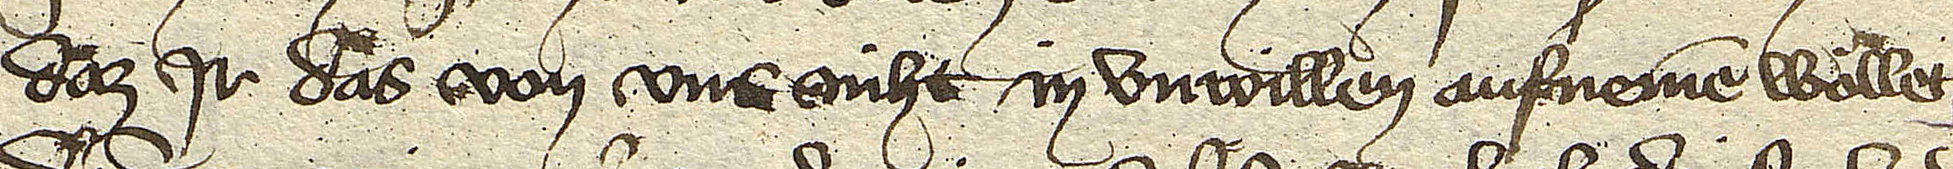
daʒ Ir das von vns niht in vnwillen aufneme* wöllet
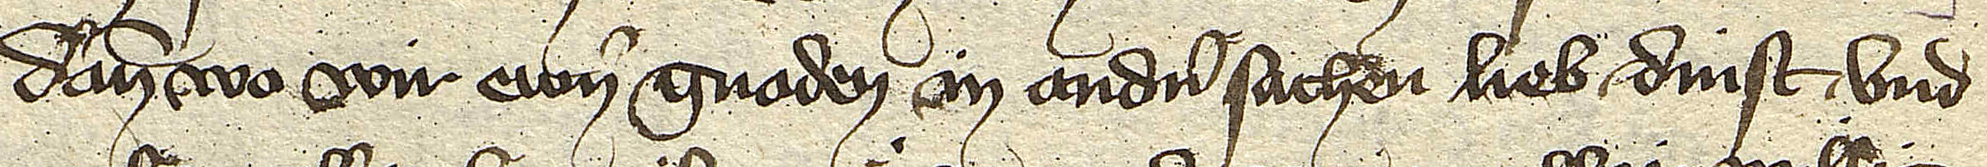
dan* wo wir ewn* gnaden in andn* ſachen lieb / dinſt / vnd
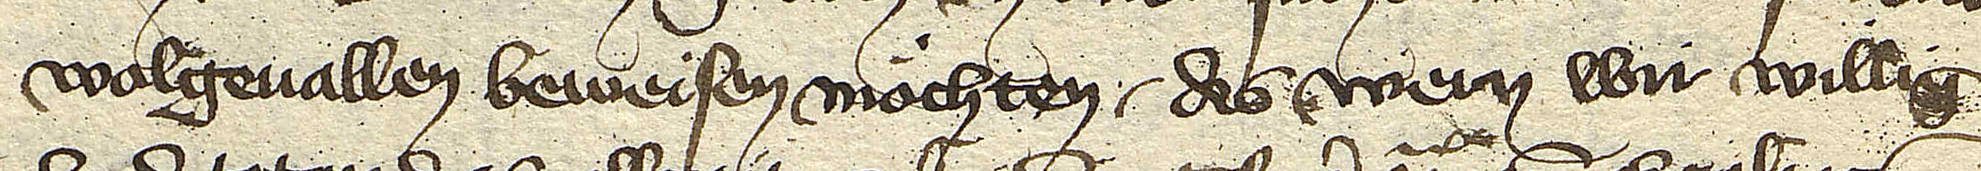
wolgeuallen beweiſen möchten / des wern wir willig
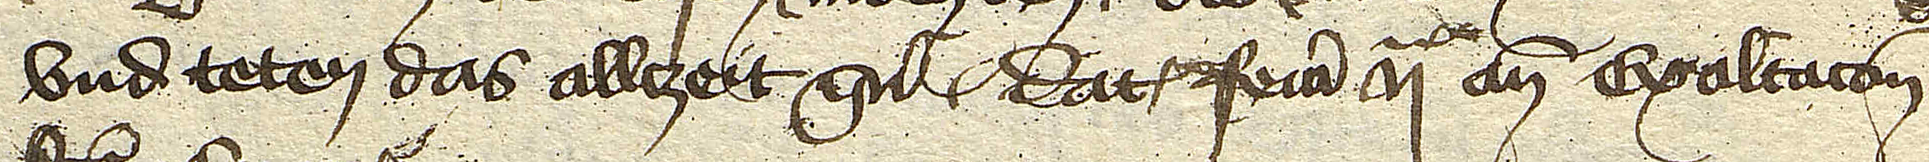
vnd teten das allcʒeit gn* / dat* feia* ii* an* Exaltacon*
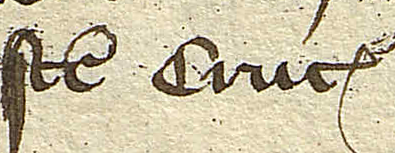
ſce* Cruc*
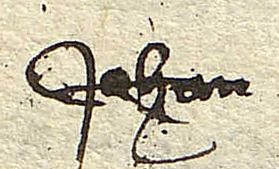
Iohan
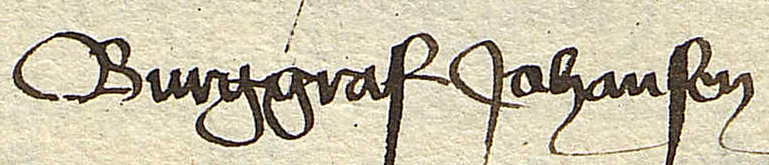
Burggraf Iohanſen
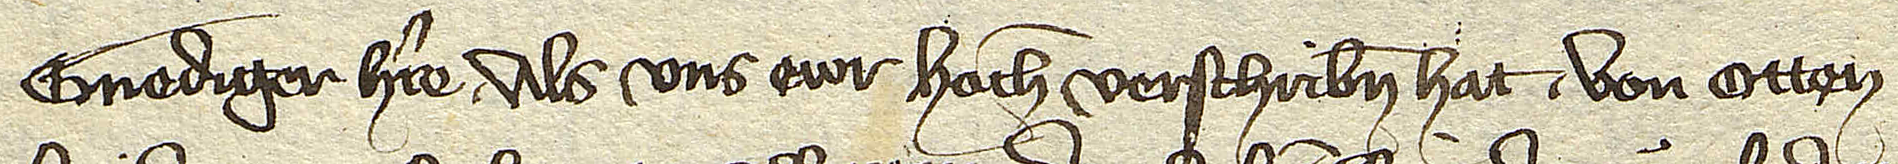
Gnediger h*re / Als vns ewr hoch* verſchribn* hat / von Otten
